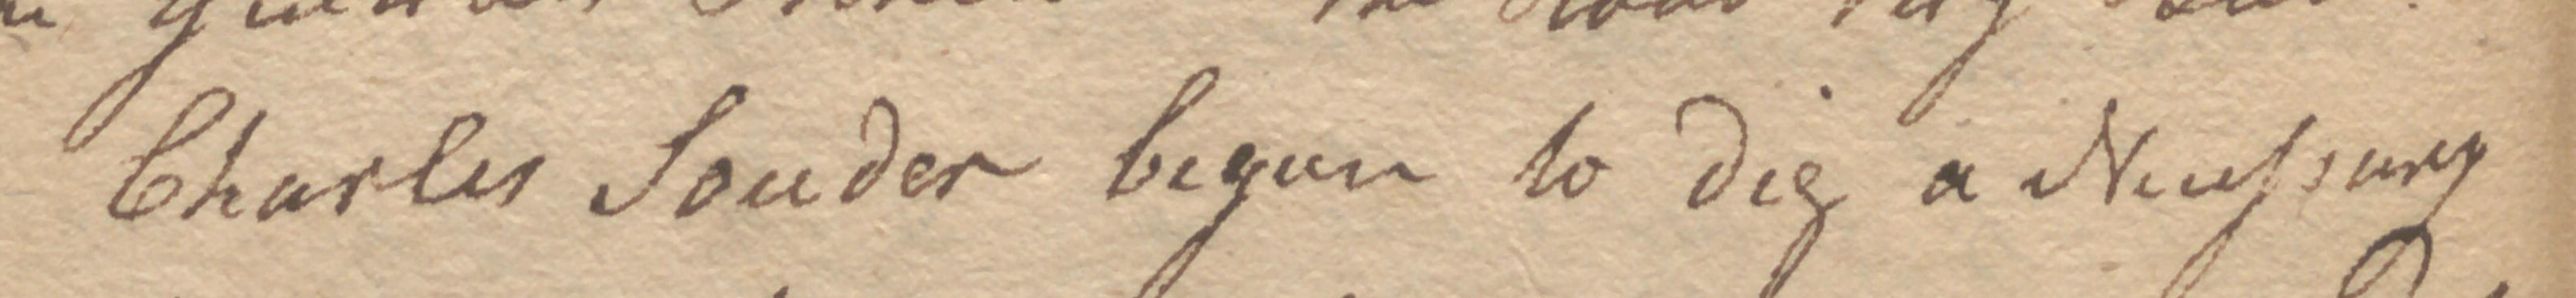Charles Souder begun to dig, a Necessary
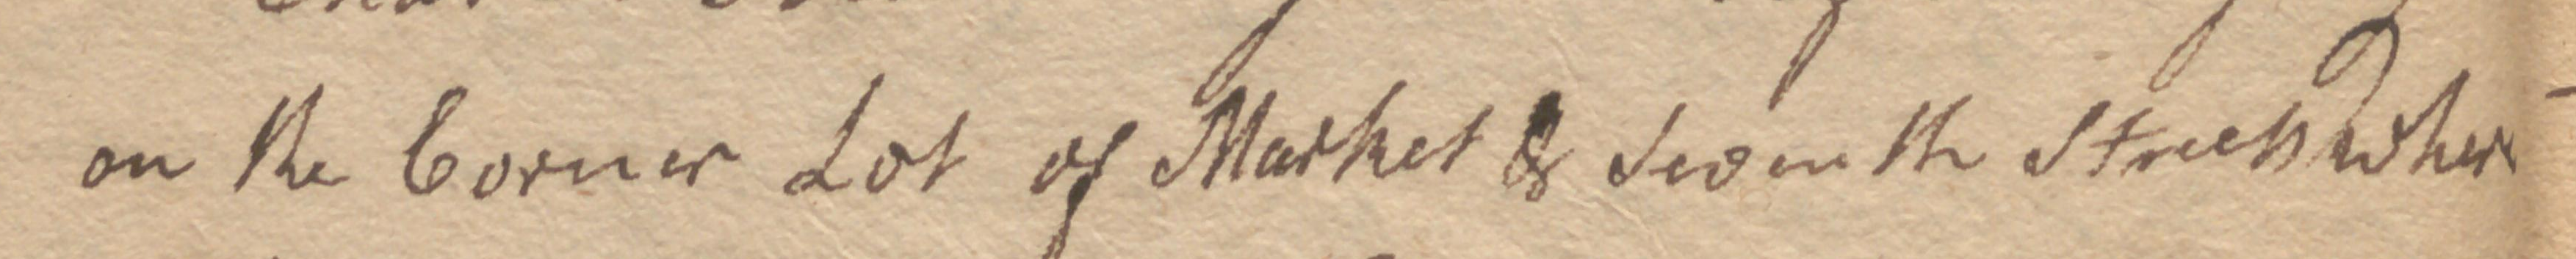on the Corner Lot of Market & Seventh Streets where
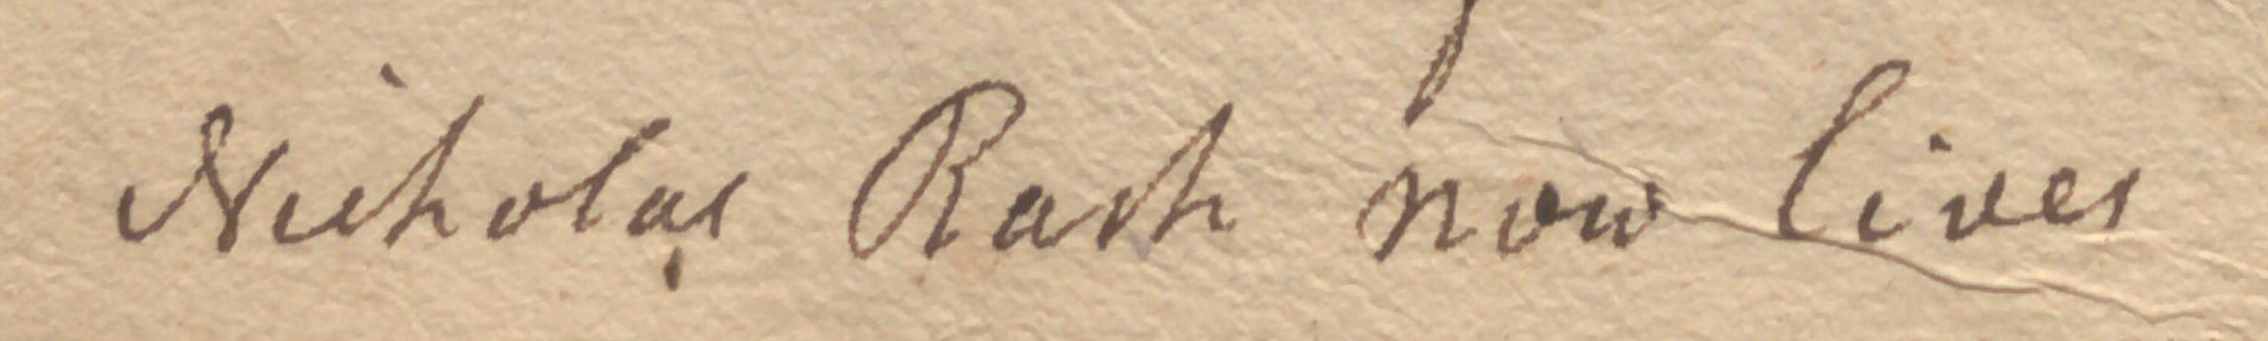Nicholas Rash now lives
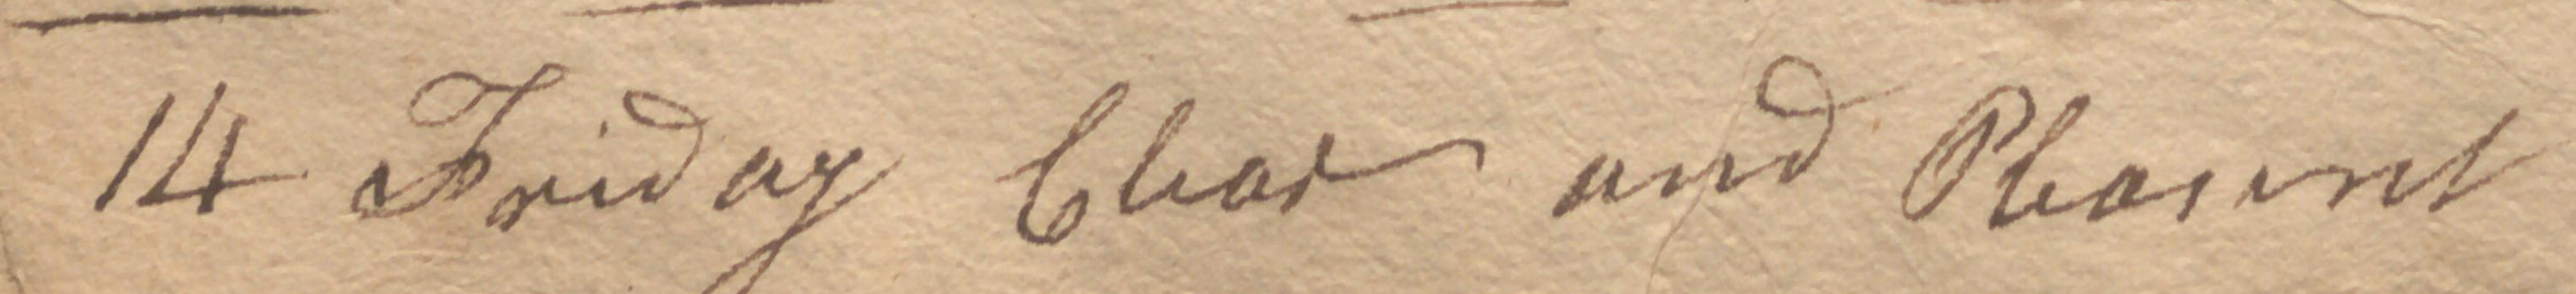14 Friday Clear and Pleasent
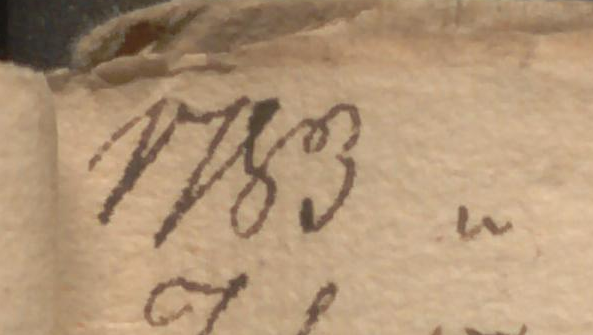1783
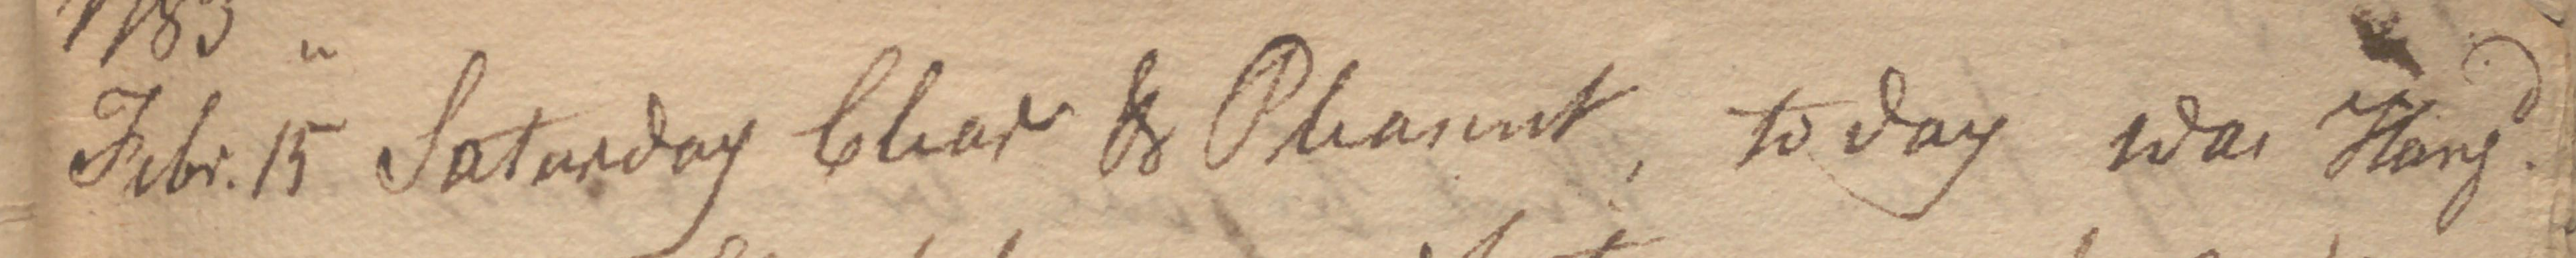Feb^r. 15 Saturday Clear & Pleasent, to day was Hang^d
